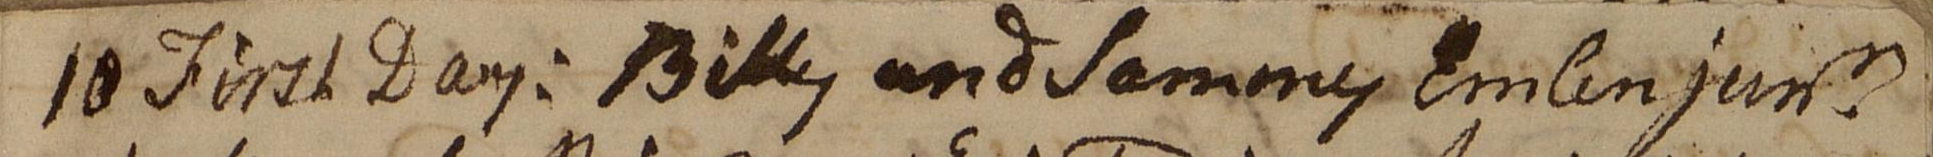10 First Day: Billy and Sammy Emlen jun^r.
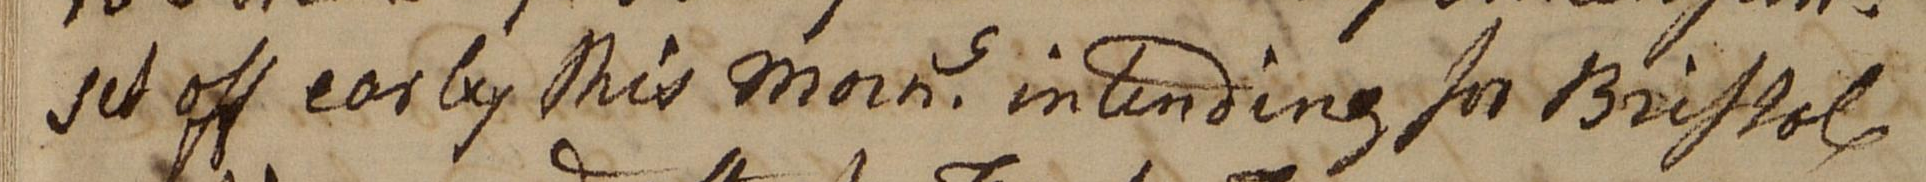set off early this morn^g. intending for Bristol
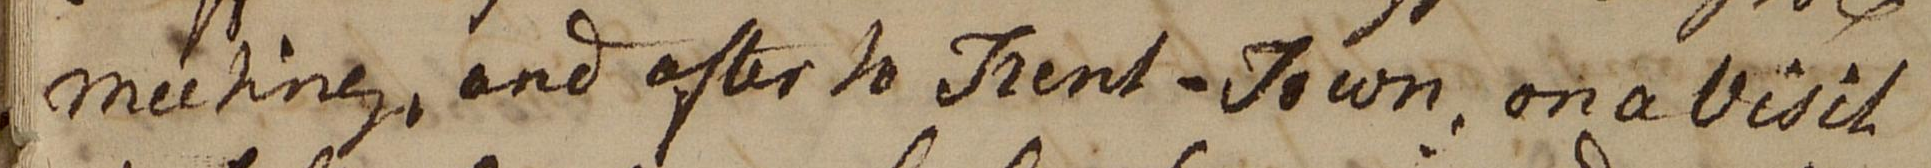meeting, and after to Trent-Town, on a Visit
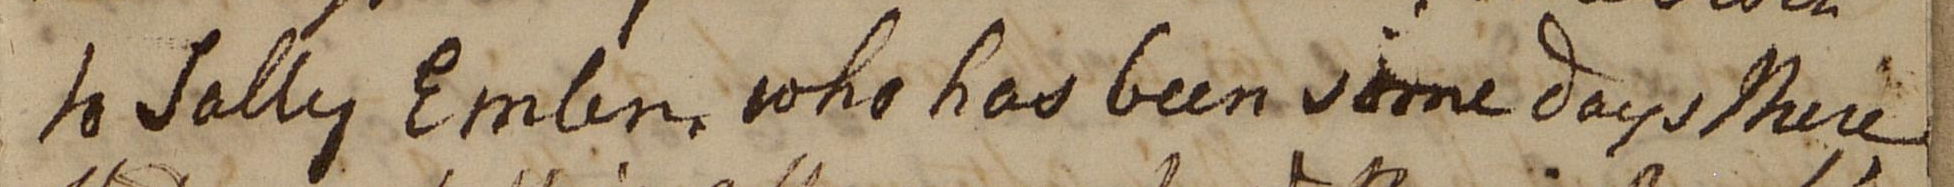to Sally Emlen, who has been some days there
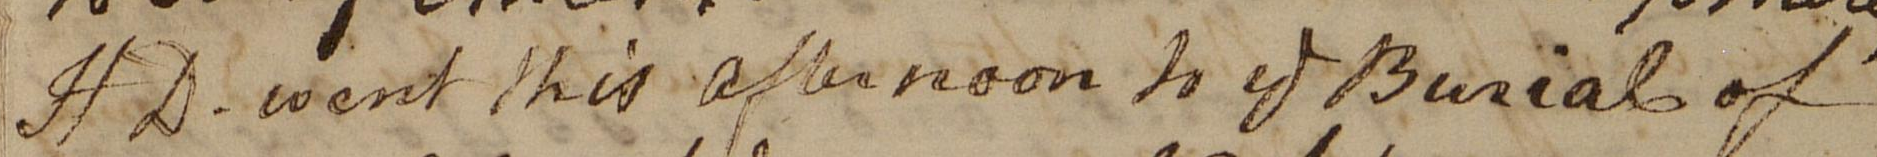HD- went this afternoon to y^e Burial of
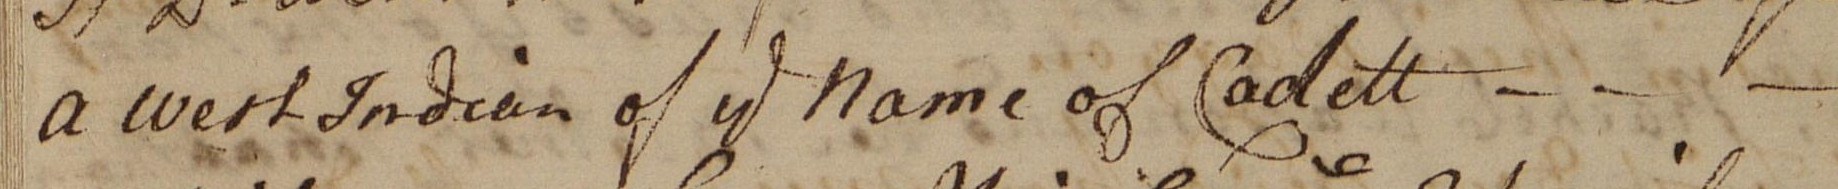a wert Indian of y^e name of Cadett---
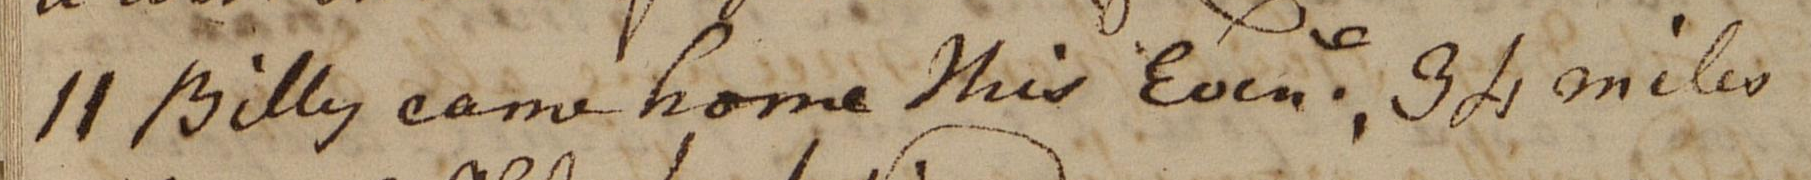11 Billy came home this Even^g. 34 miles
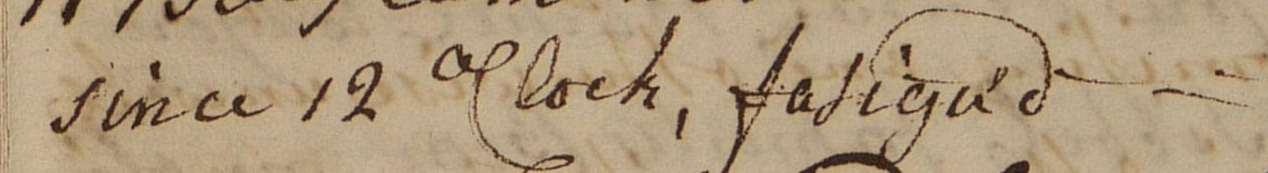since 12 ^o Clock, fatigu'd
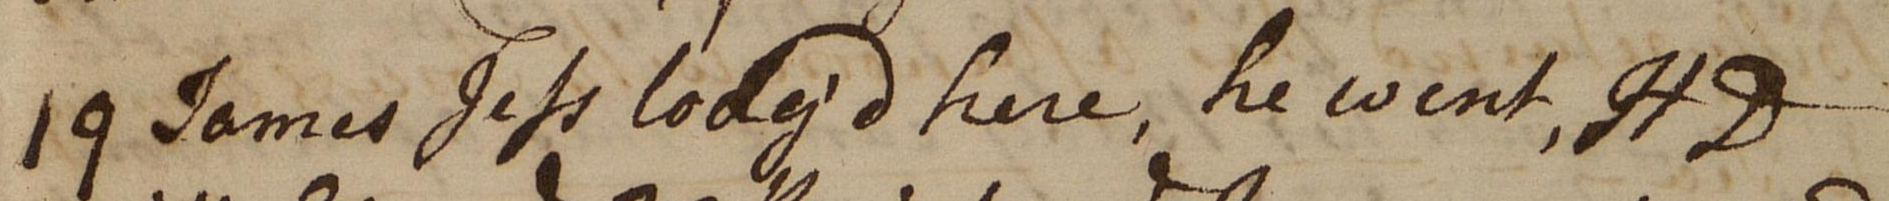19 James Jess lodg'd here, he went, HD
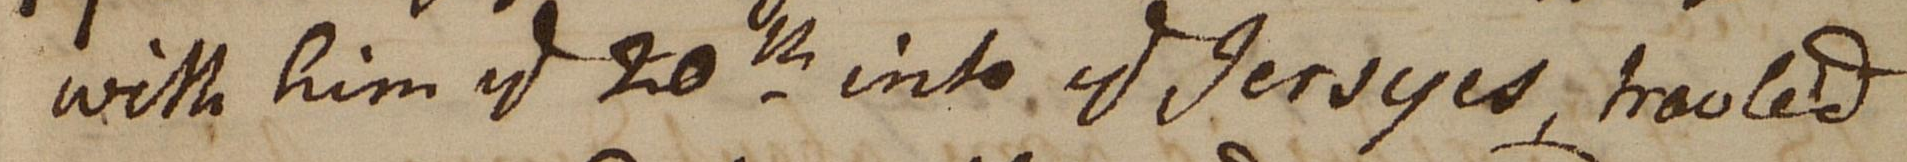with him y^e 20^th into y^e Jersyes, travled
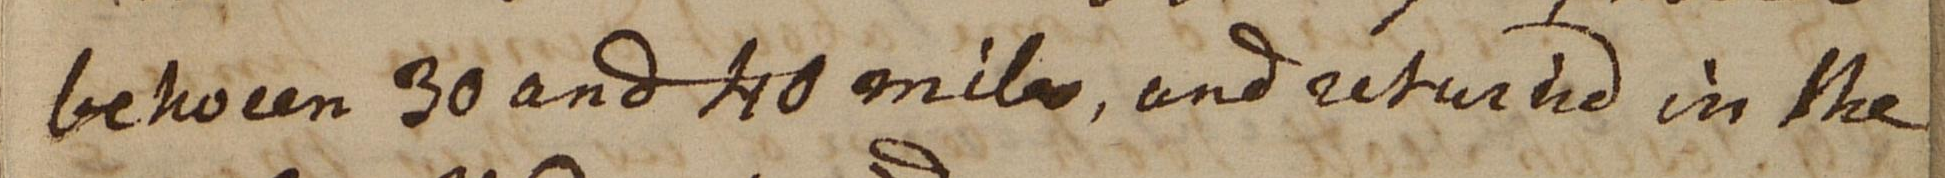between 30 and 40 mile, and return'd in the
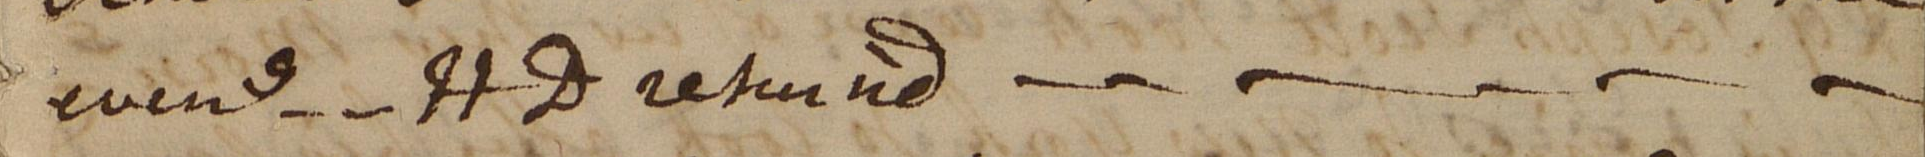even^g- HD return'd----
